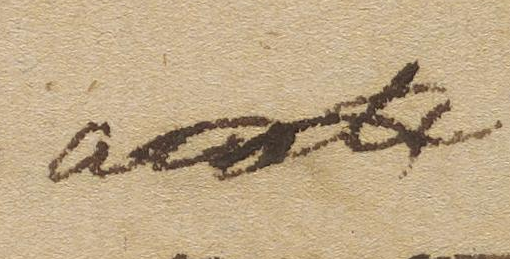acute
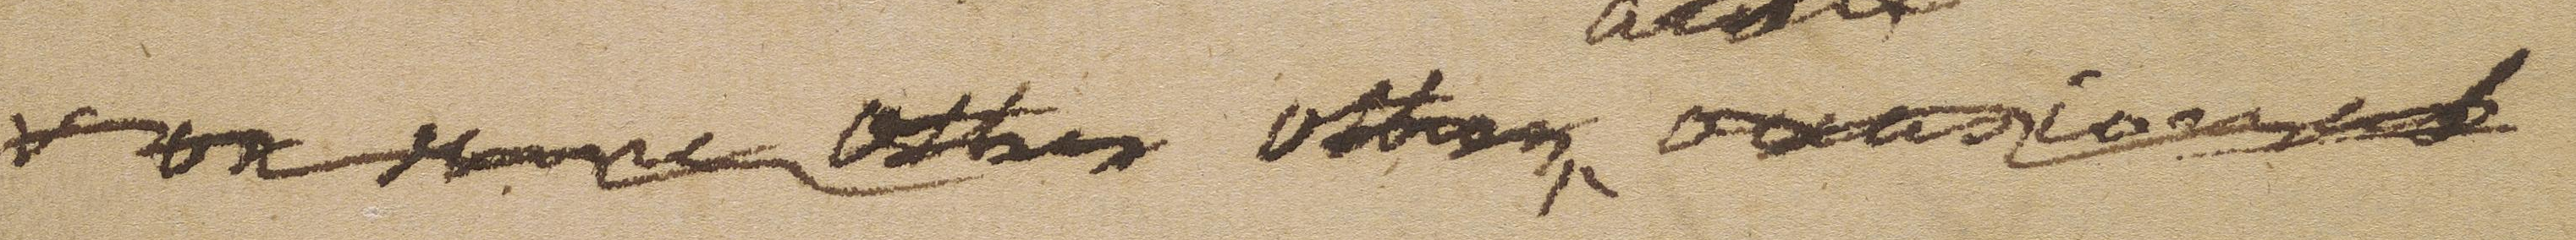V on more other other ^ occasioned
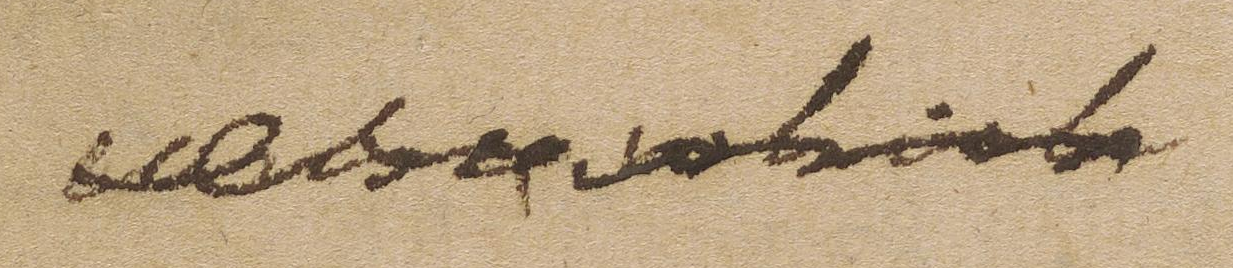excesive
